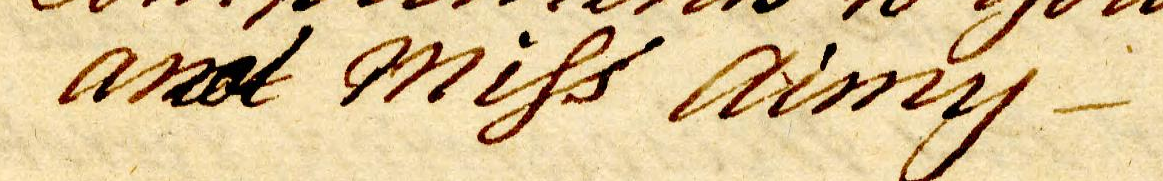and Miss Aimy-
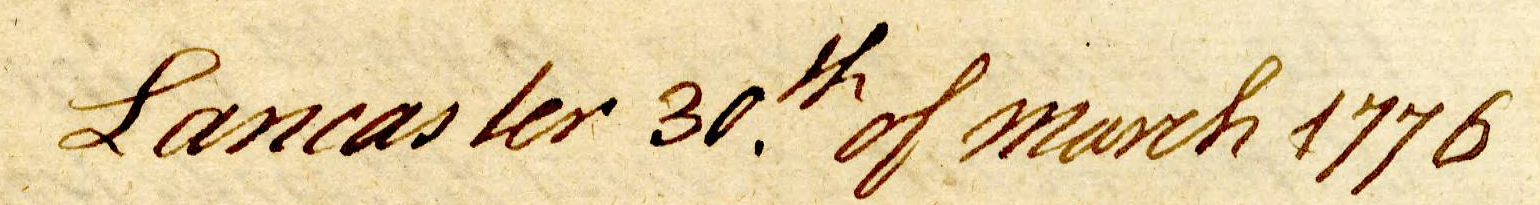Lancaster 30^th. of March 1776
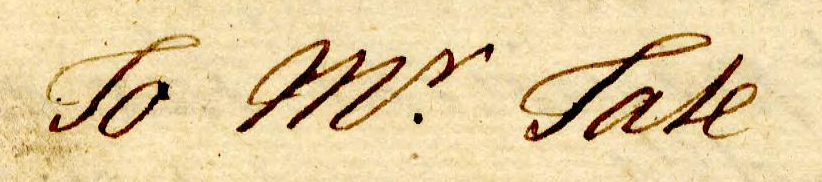To M^r. Tate
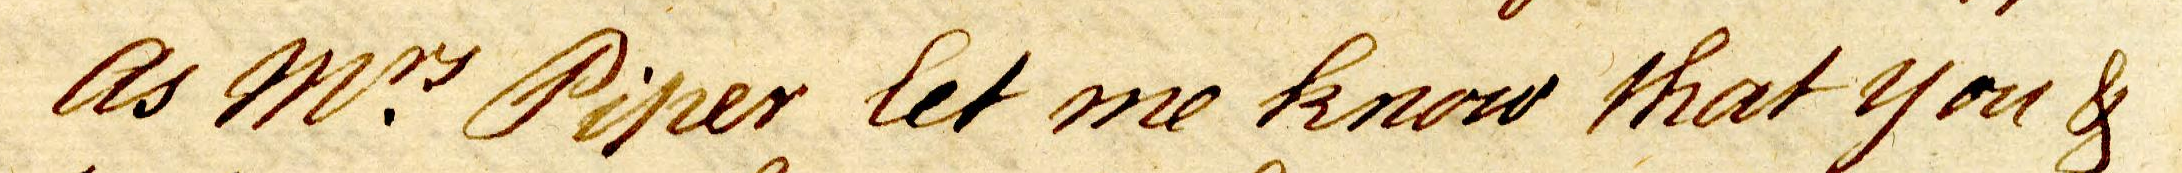As M^rs. Piper let me know that You &
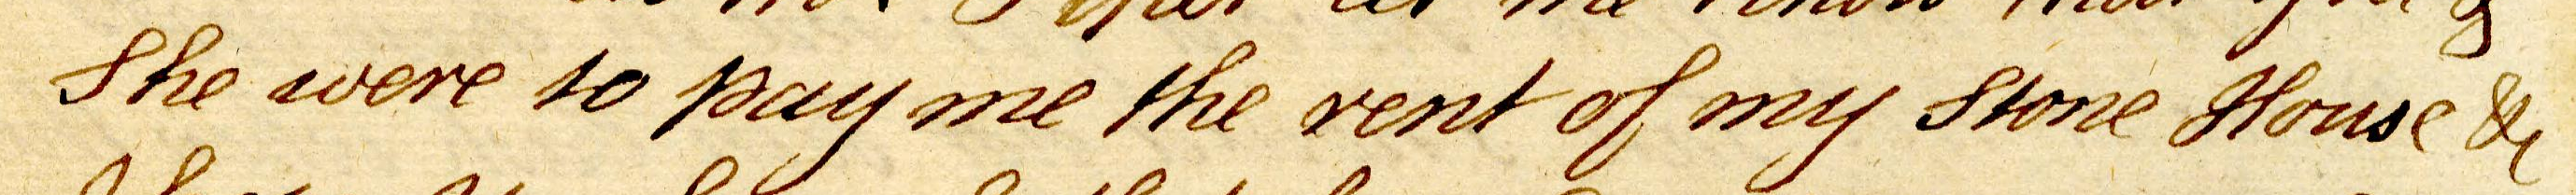She were to pay me the rent of my Stone House &
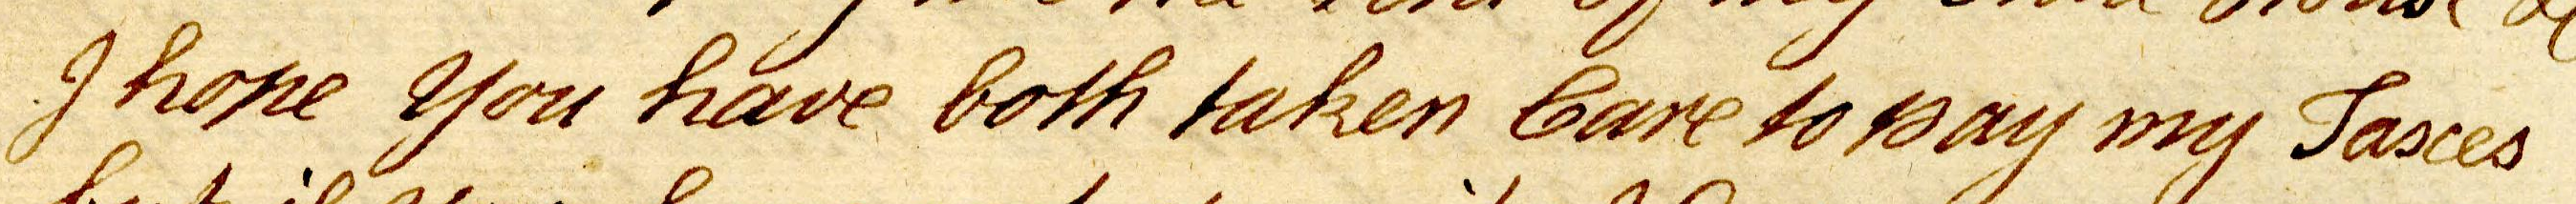I hope You have both taken Care to say my Taxes
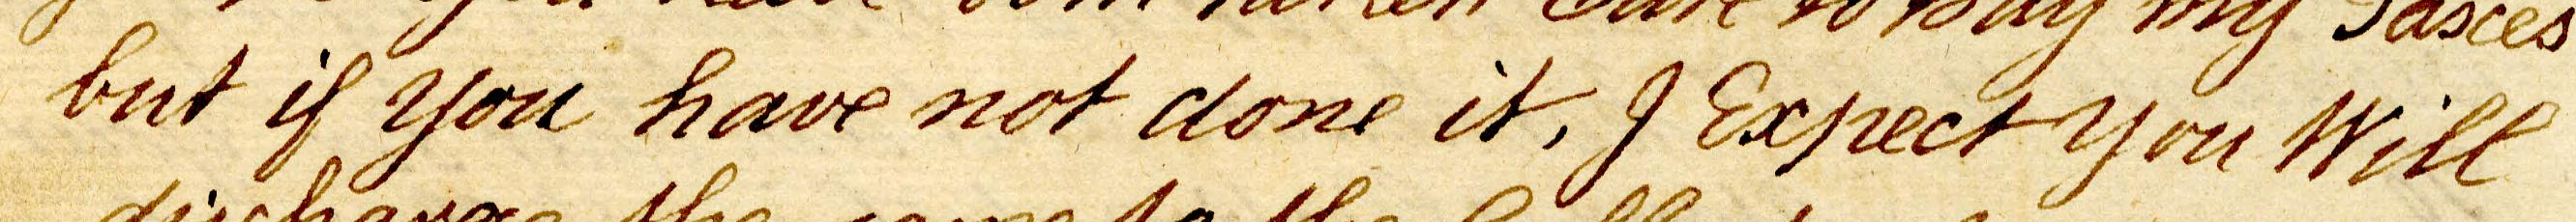but if you have not done it, I Expect you Will
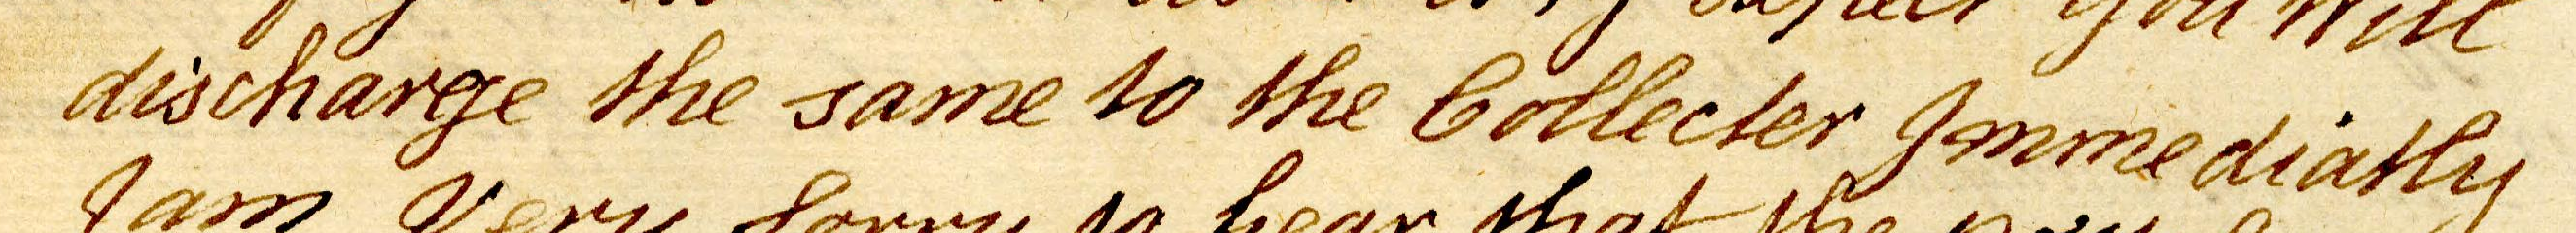discharge the same to the Collecter Immediatly
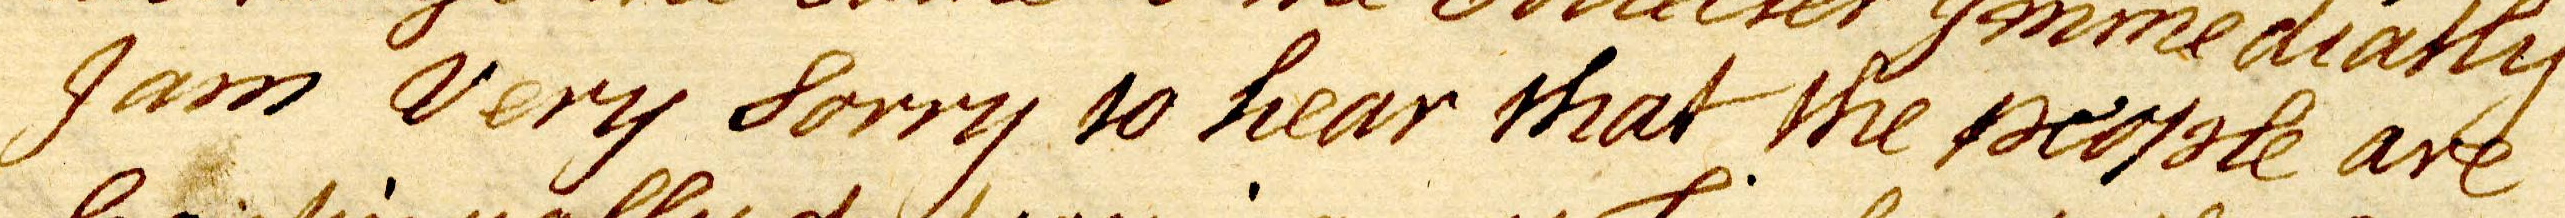I am very sorry to hear that the people are
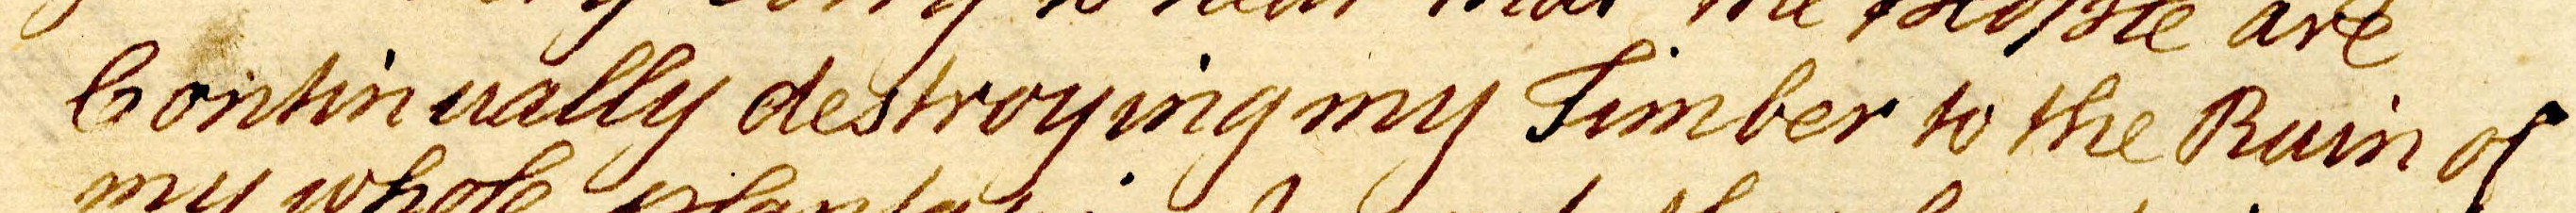Continually destroying my Timber to the Ruin of
